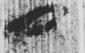厶（私）
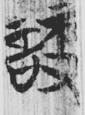○（便）
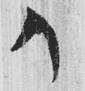人
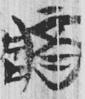𨟻（將）
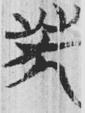○（笑）
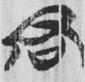君
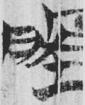陵
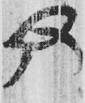尹
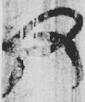尹
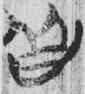皆
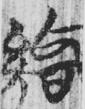○（紿）
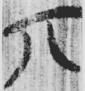亓（其）
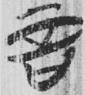言
